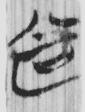甚
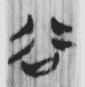谷
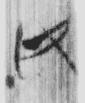女
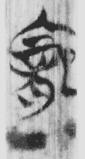寵
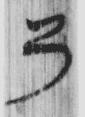乃
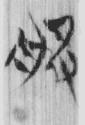服
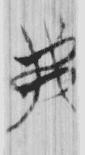弗
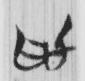爲
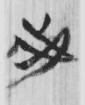我
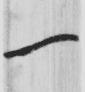一
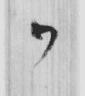人
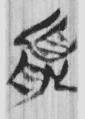{月頁}
